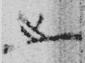之
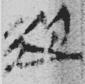從
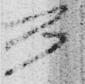乃
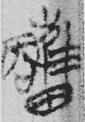○（維）
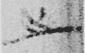之
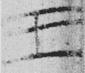王
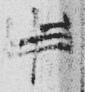用
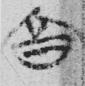亯
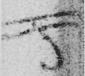于
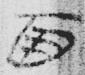西
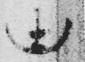山
